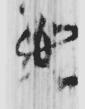心
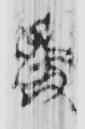{爯又}
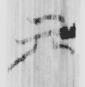亓
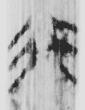行
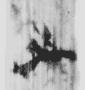之
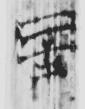厚
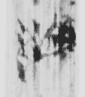泊
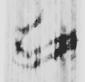㠯（以）
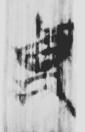史
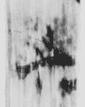之
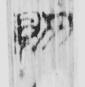則
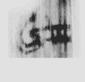母
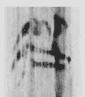從
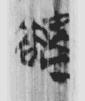欲
